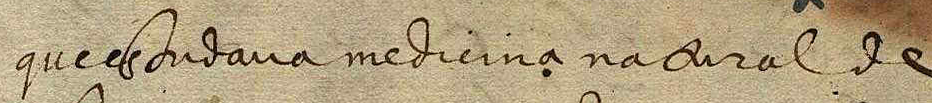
que estudaua medicina natural de
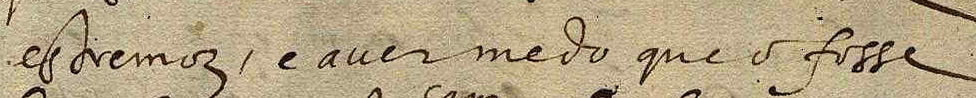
estremoz , e auer medo que o fosse
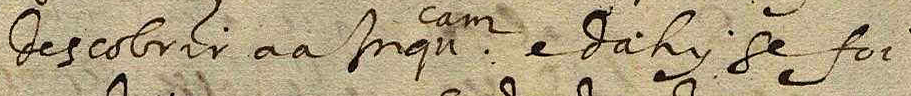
descobrir aa Jnqucam: e dahy se foi
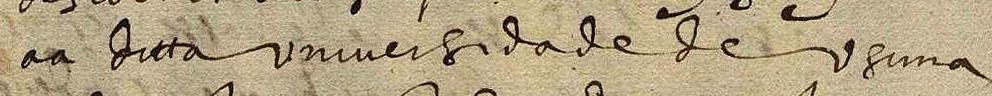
aa ditta vniuersidade de vsuna
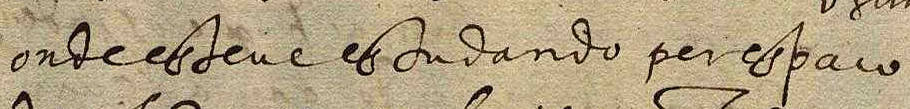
onde esteue estudando per espaço
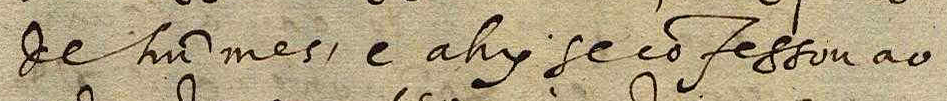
de hū mes, e ahy se cōfessou ao
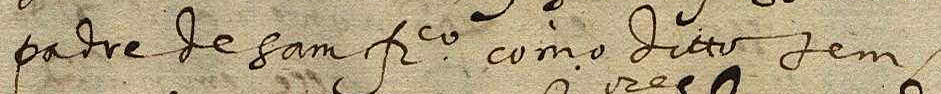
padre de sam frco. como ditto tem,
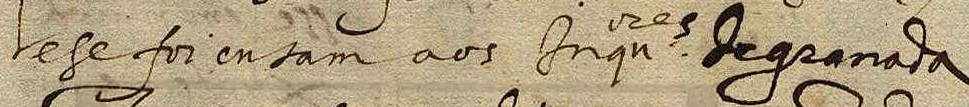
e se foi entam aos Jnquores. de granada
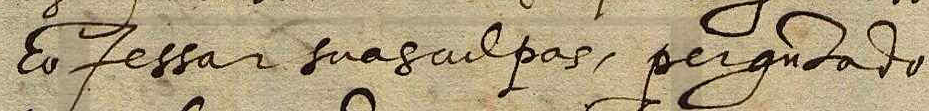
cōfessar suas culpas, pergūtado
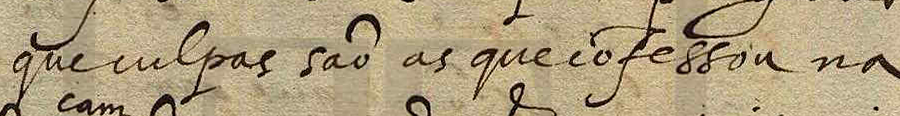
que culpas são as que cōfessou na
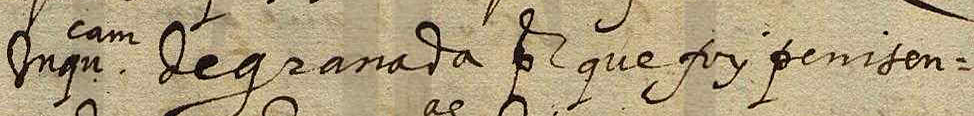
Jnqu.cam de granada por que foy peniten
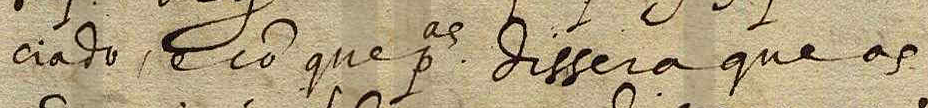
ciado, e cō que pas. dissera que as
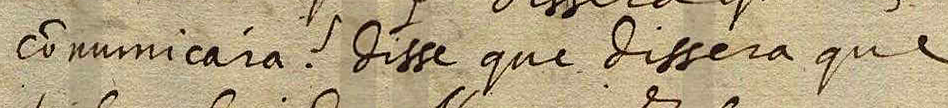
cōmunicara? disse que dissera que
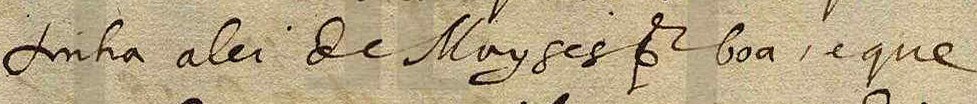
tinha a lei de Moyses por boa, e que
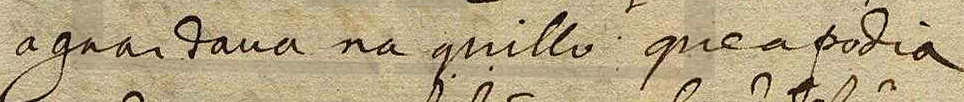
a guardaua naquillo que a podia
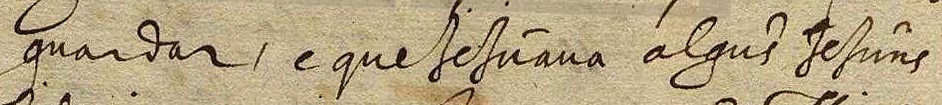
guardar , e que JeJuāua algūs JeJun̄s
